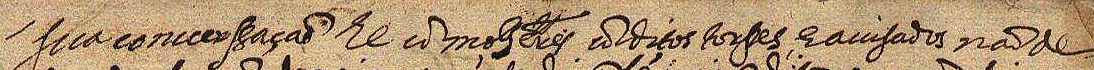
sua conuerssaçaõ he cō molheres cō ditos torpes, E auisados naõ de
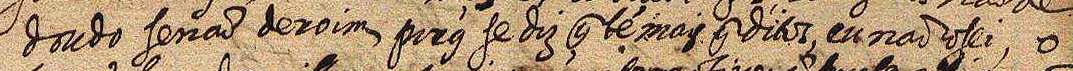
doudo senão de roim porq̄ se diz q̄ tē mais q̄ ditos, eu naõ o sei, o
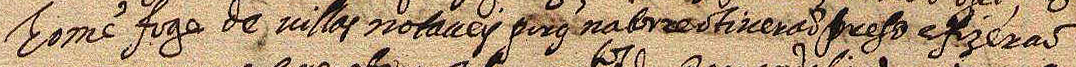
homē foge de uillas notaueis porq̄ na torre o tiueraõ preso E fizeraõ
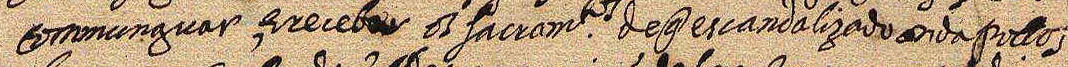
communguar, E receber os sacram.tos de q̄ escandalizado anda pollos
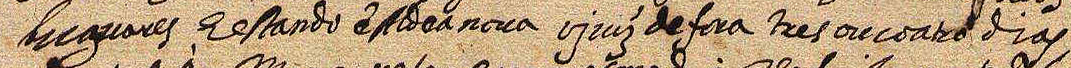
luguares E estando ē Aldea noua o juiz de fora tres ou coatro dias
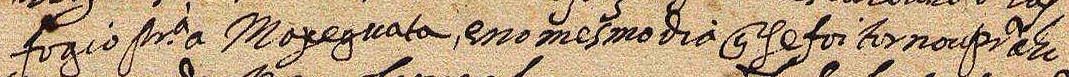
fogio pr.a a Moxeguata, E no mesmo dia q̄ se foi tornou pra ahi
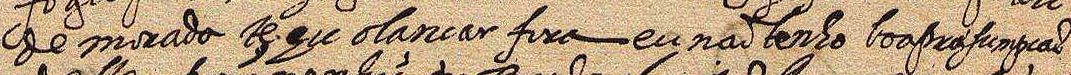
de morada te Eu o lançar fora eu naõ tenho boa prasumpçaõ
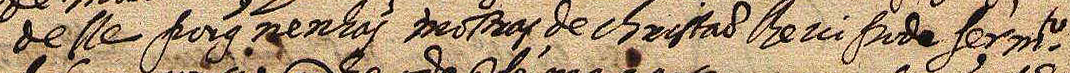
delle porq̄ nenhas̄ mostras de christaõ lhe ui pode ser mto.
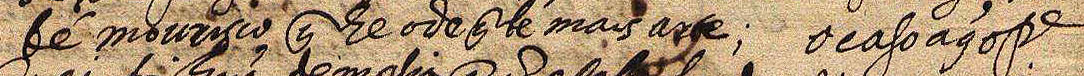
bē mourisco q̄ he o de q̄ tē mais arte; o caso a q̄ o pe
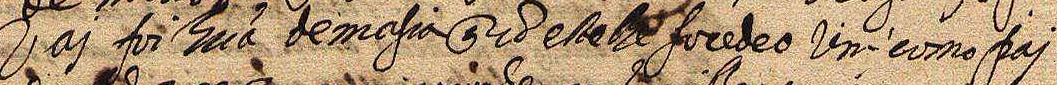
Vaj foi huā demasia q̄ cō elle lhe socedeo vm como paj
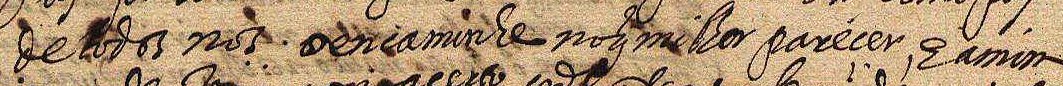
de todos nos o encaminhe no q̄ milhor parecer, E a mim
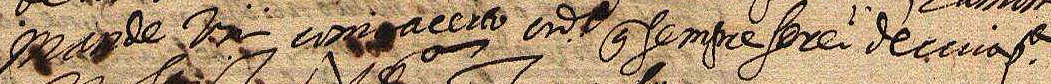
mande vm como a certo crd.o q̄ sempre serei de cuia p.a
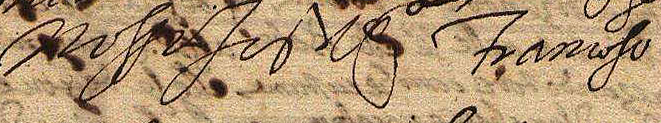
nosso sor &.a trancoso
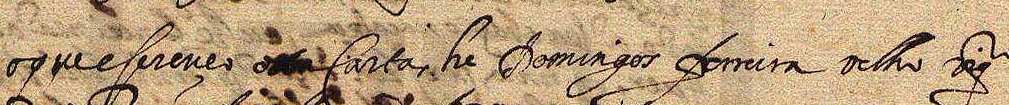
o que escreueo esta Carta, he Domingos ferreira velho vigro
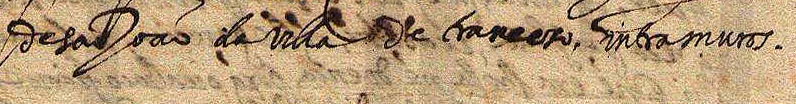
de saõ Joaõ da villa de trancoso, intramuros.
